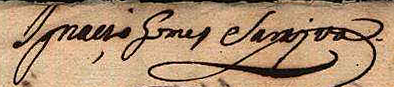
Ignacio Gomes Sarajva.
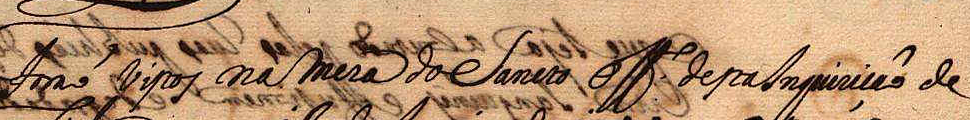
Foraõ vistos na meza do Sancto Off.o desta Inquiziçaõ de
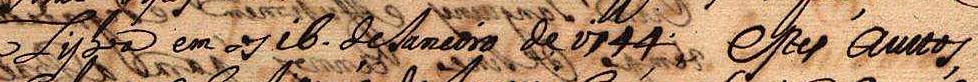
Lisboa em os 16. de Ianeiro de 1744, estes auttos,
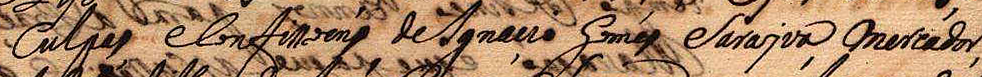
Culpas, e Confissoen̄s de Ignacio Gomes Sarajva, mercador,
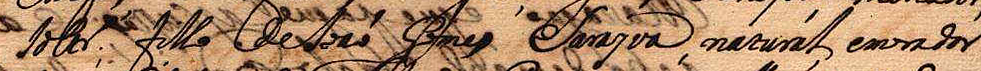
soltr.o filho de Ioaõ Gomes Sarajva, natural, e morador
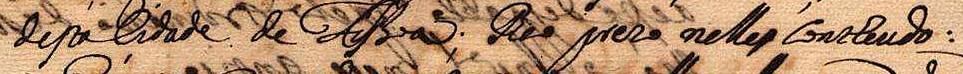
desta Cidade de Lisboa; Reo prezo nelles contheudo:
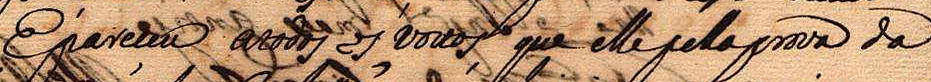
E pareceu a todos os vottos que elle pella prova da
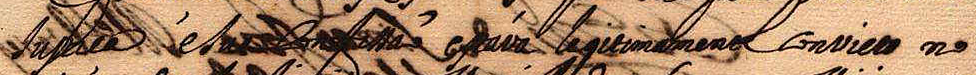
Iustiça e sua Confissaõ estava legitimamente convicto no
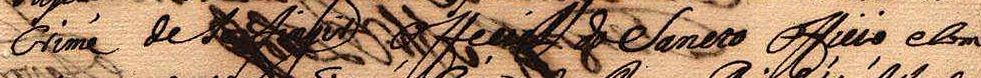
crime de se fingir Offecial do Sancto Officio, e com
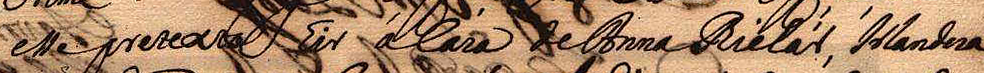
esse pretexto hir a Caza de Anna Richar, Irlandeza
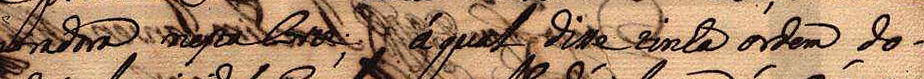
moradora nesta Corte, á qual disse tinha ordem do
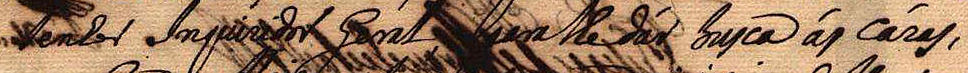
Senhor Inquizidor Geral, para lhe dar busca ás cazas,
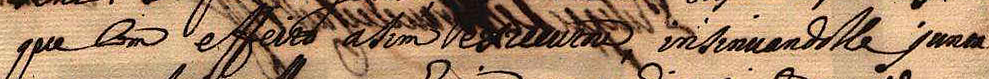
que com effeito asim exzecutou, insinuandolhe junta
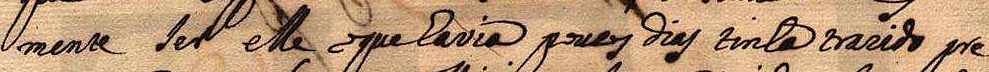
mente ser elle o que havia poucos dias tinha trazido pre
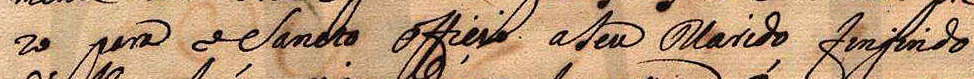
zo para o Sancto officio a seu Marido, fingindo
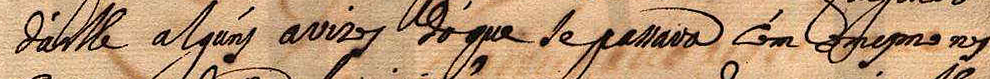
darlhe alguns avizos do que se passava com o mesmo nos
